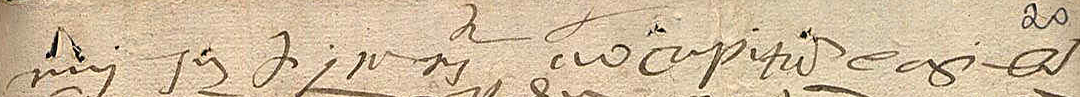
muj Jmtejramte ao capitaõ e asi bē
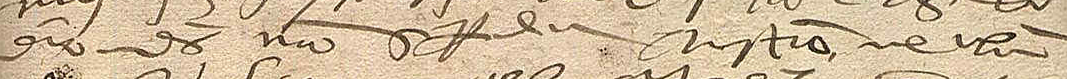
dito ds̄ não se ꝑdeu cristão nenhū
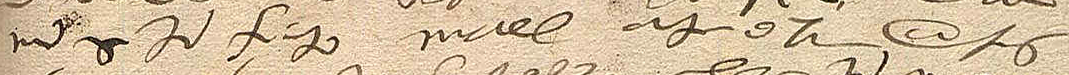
nē se tē feito mall ate oJe ātes
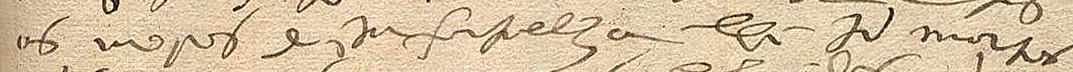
os moros desta fortalleza lhe tē mortos
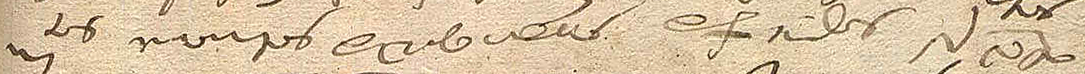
mtos mouros e cavallos e feridos sē cōta
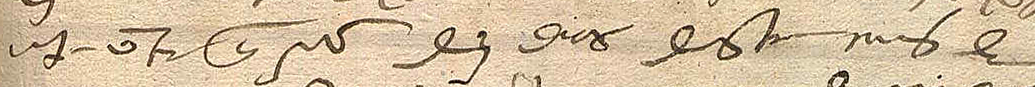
ate oJe q̄ saõ dez dias deste mes de
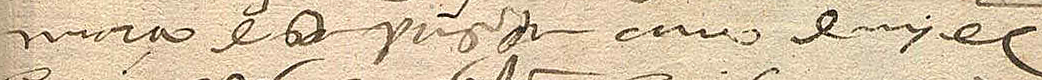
março deste presēte anno de mjll
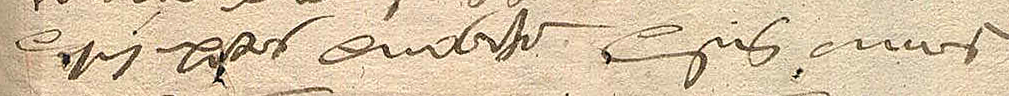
e qujnhētos e novēta e seis annos
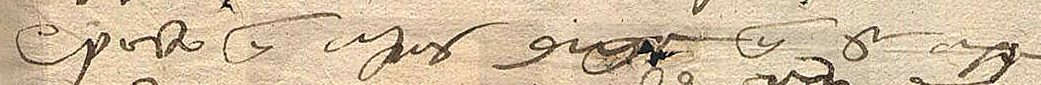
e posto q̄ atras diga q̄ se apre
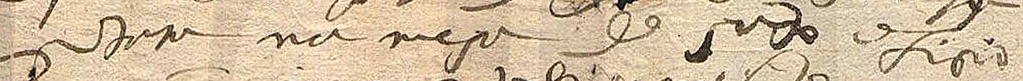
sētara na mesa do sāto ofisio
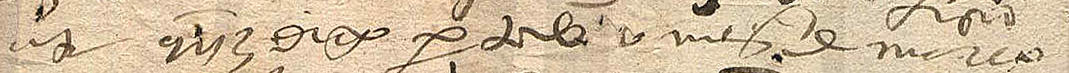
ate quj̄ez digo ꝑ todo o mes de março
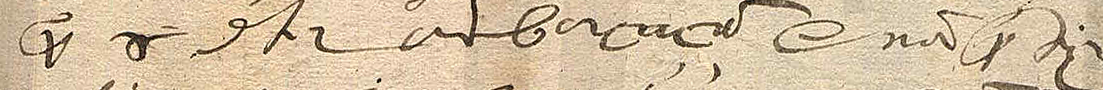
p̄o se deter a ēbarcaçaõ e naõ p̄tjr
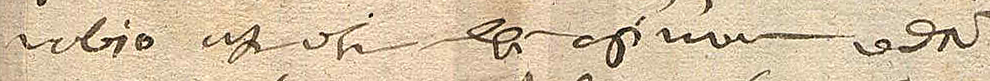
navio ate oJe lhe asinou o dtō
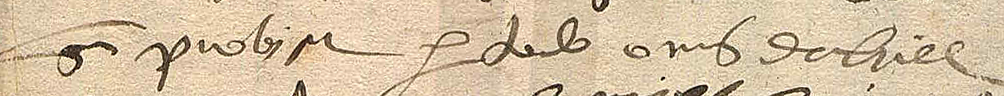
s̄or provjsor ꝑ todo o mes dabrill
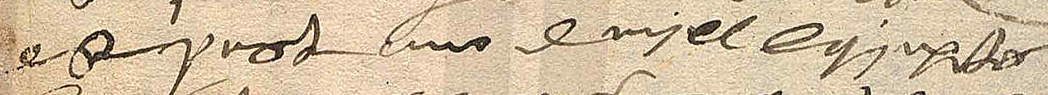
deste presēte ano de mjll e qujnhētos
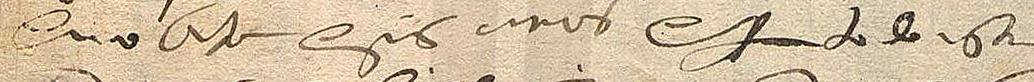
e novēta e seis anos e ꝑ todo este
